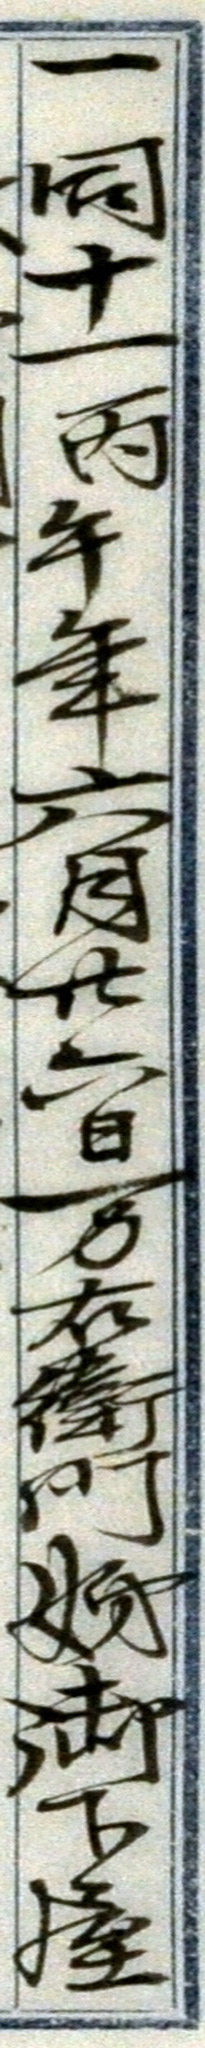一同十一丙午年六月廿六日万右衛門娣御下屋
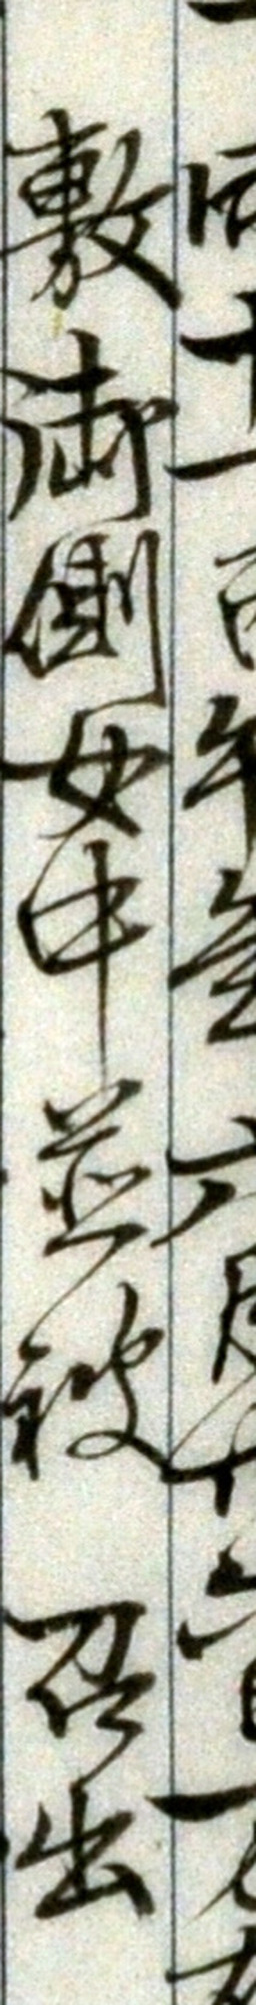敷御側女中並被召出
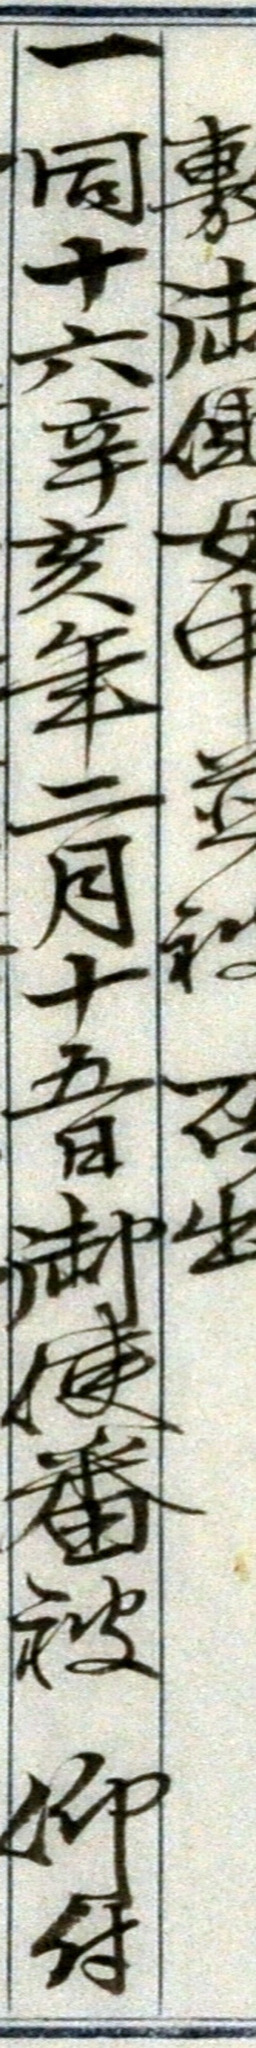一同十六辛亥年二月十五日御使番被仰付
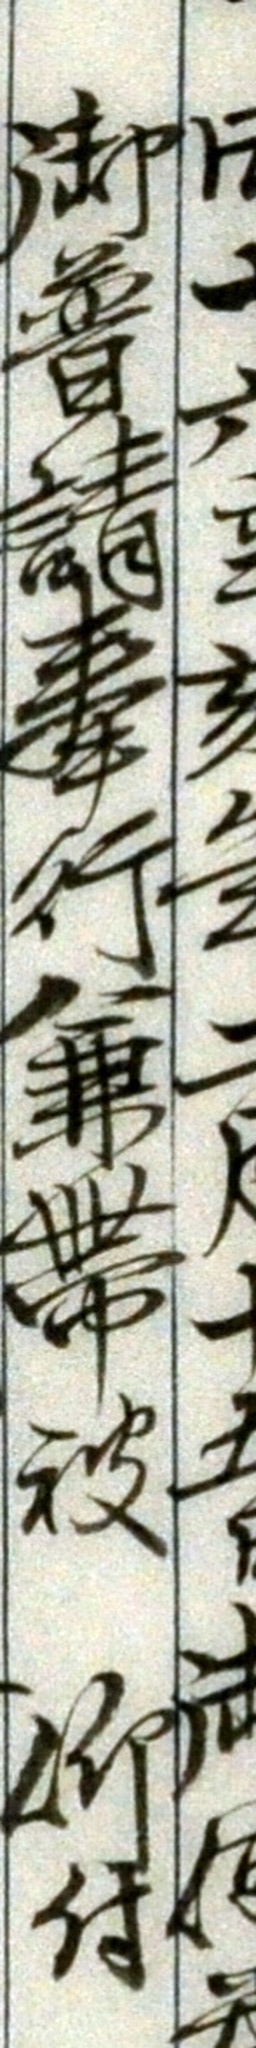御普請奉行兼帯被仰付
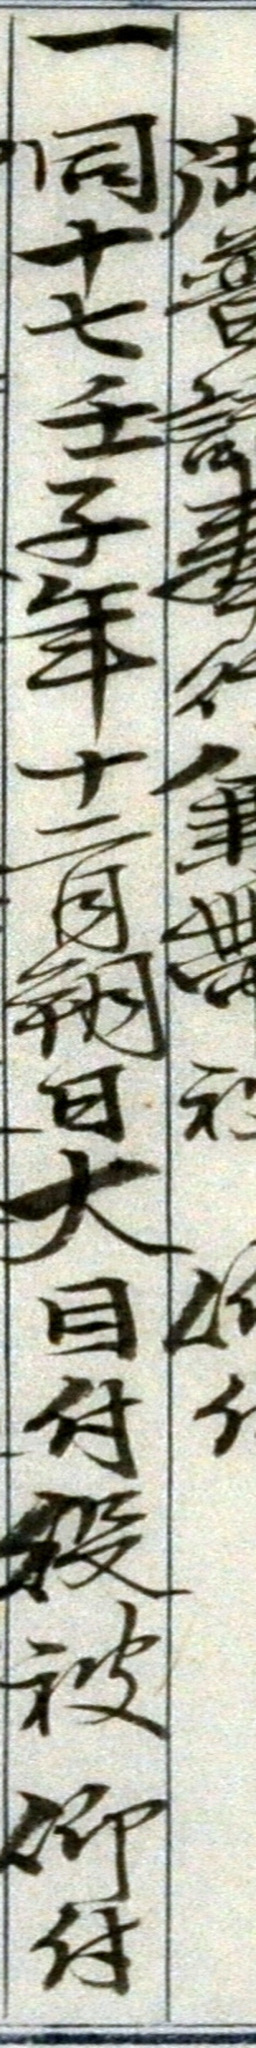一同十七壬子年十二月朔日大目付役被仰付
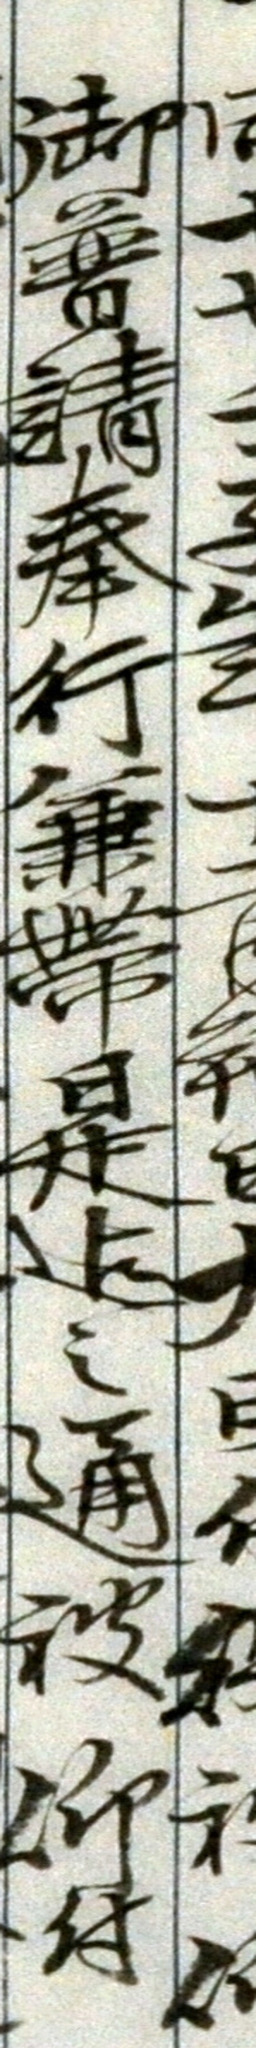御普請奉行兼帯是迄之通被仰付
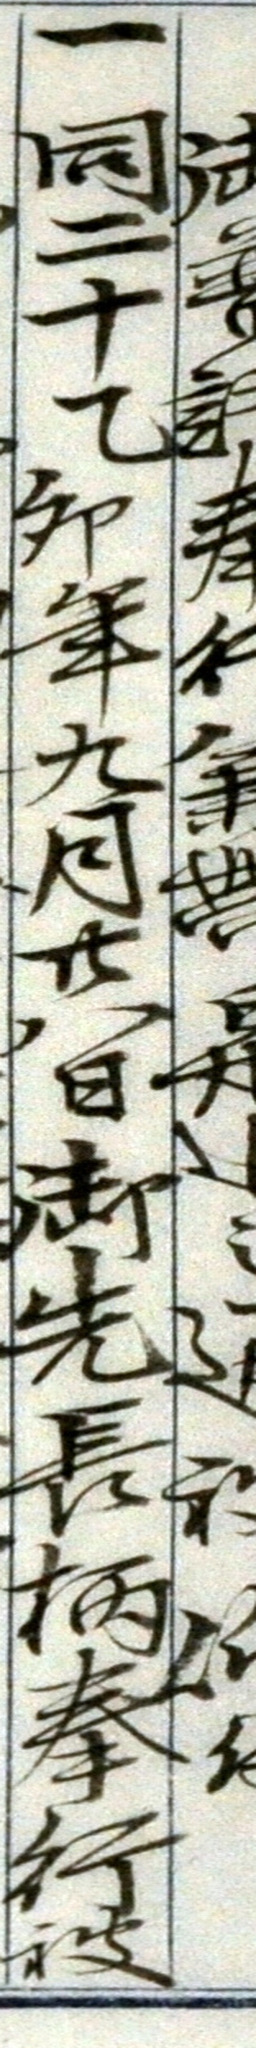一同二十乙卯年九月廿八日御先長柄奉行被
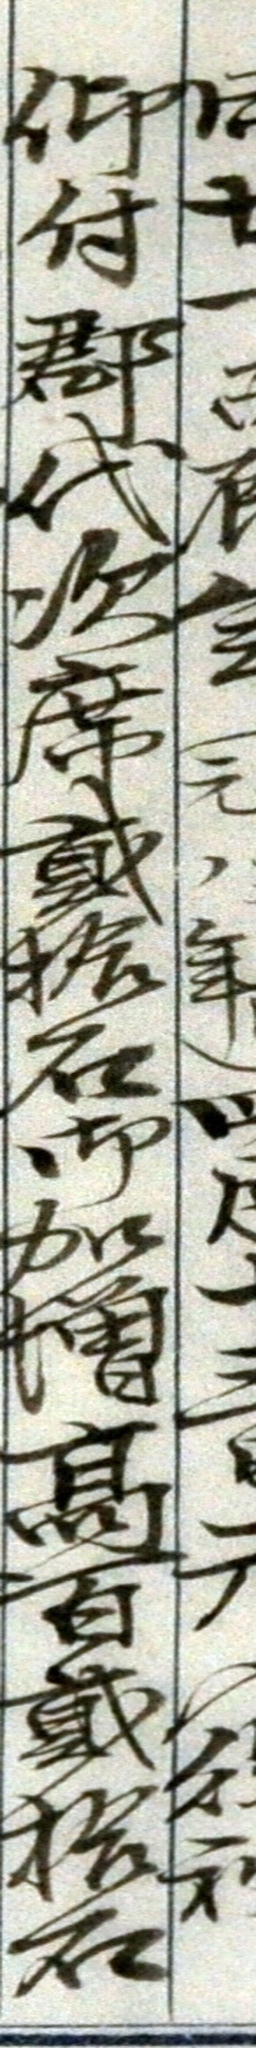仰付郡代次席弐拾石御加増高百弐拾石
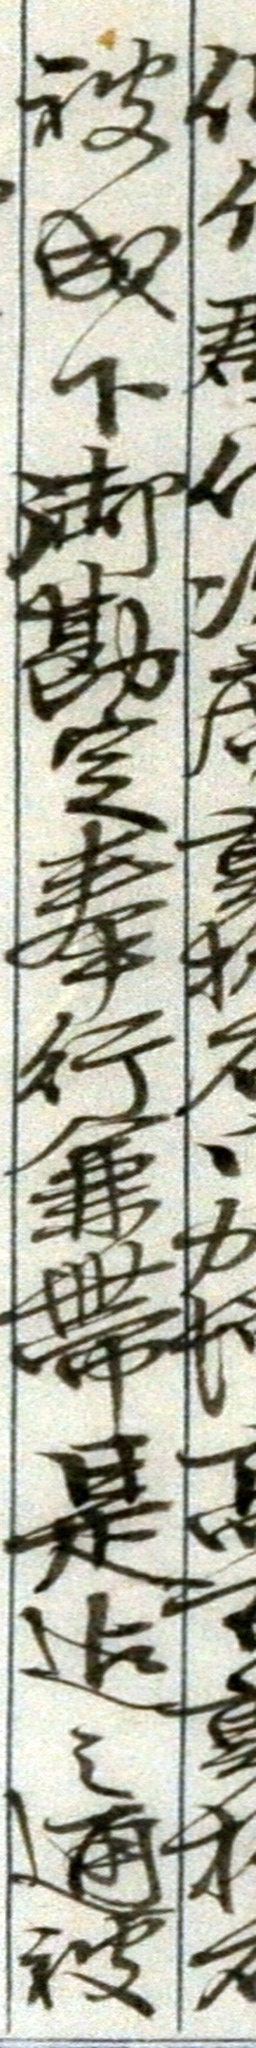被成下御勘定奉行兼帯是迄之通被

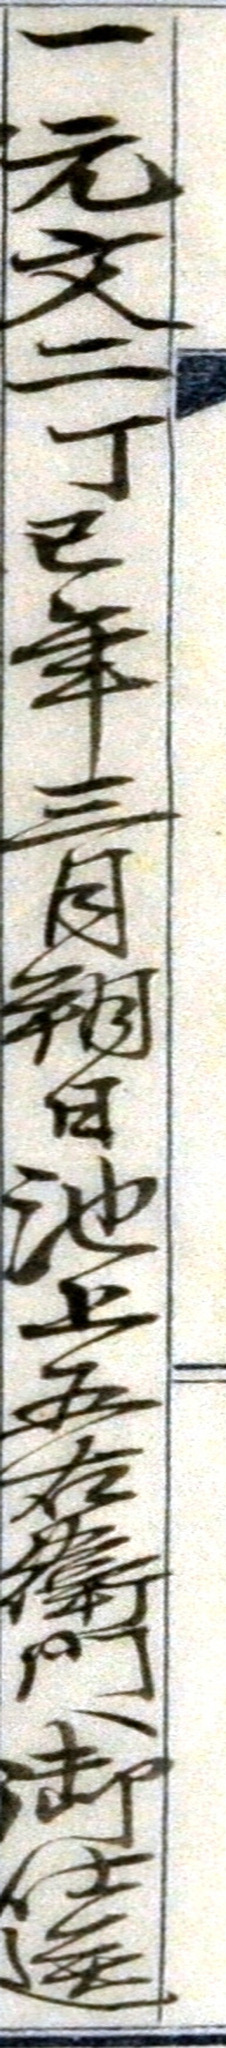一元文二丁巳年三月朔日池上五右衛門へ御仕送
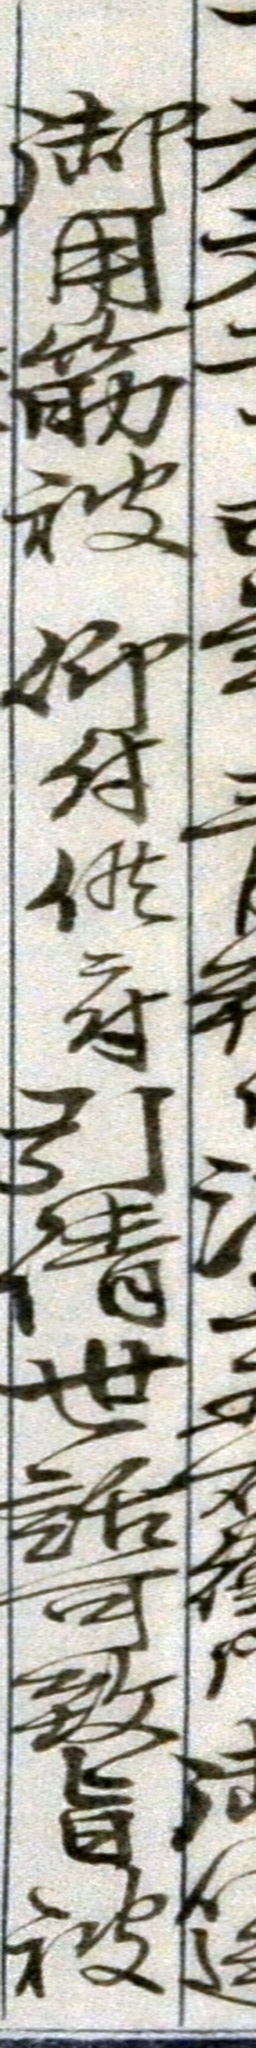御用筋被仰付候ニ付引請世話可致旨被
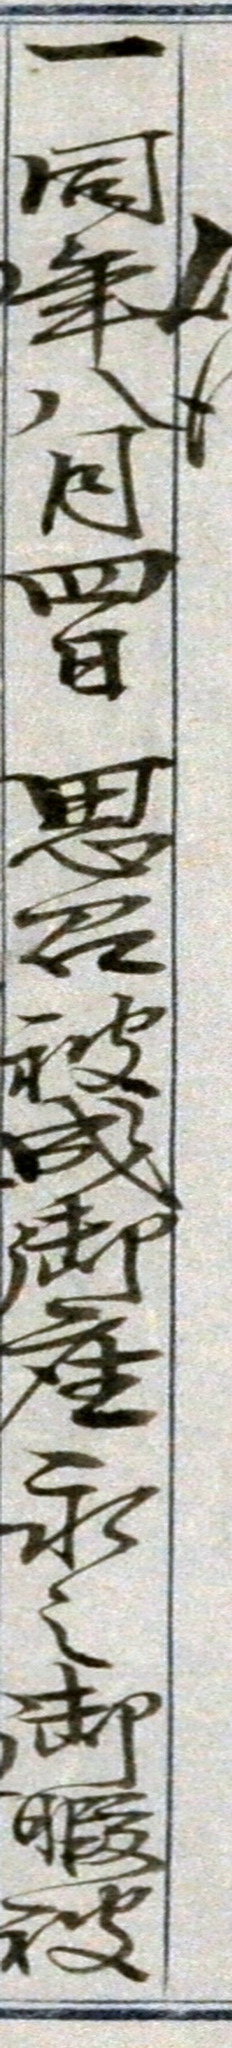一同年八月四日思召被成御座永之御暇被
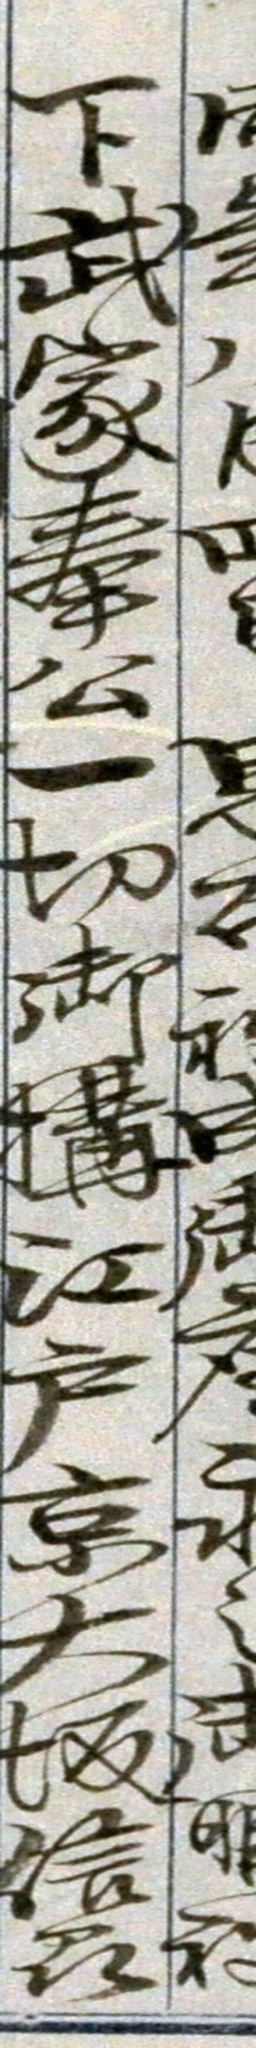下武家奉公一切御構江戸京大坂信州
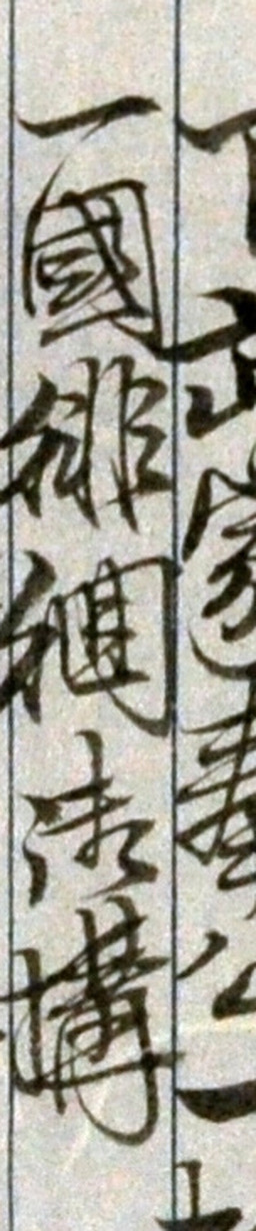一国徘徊御構
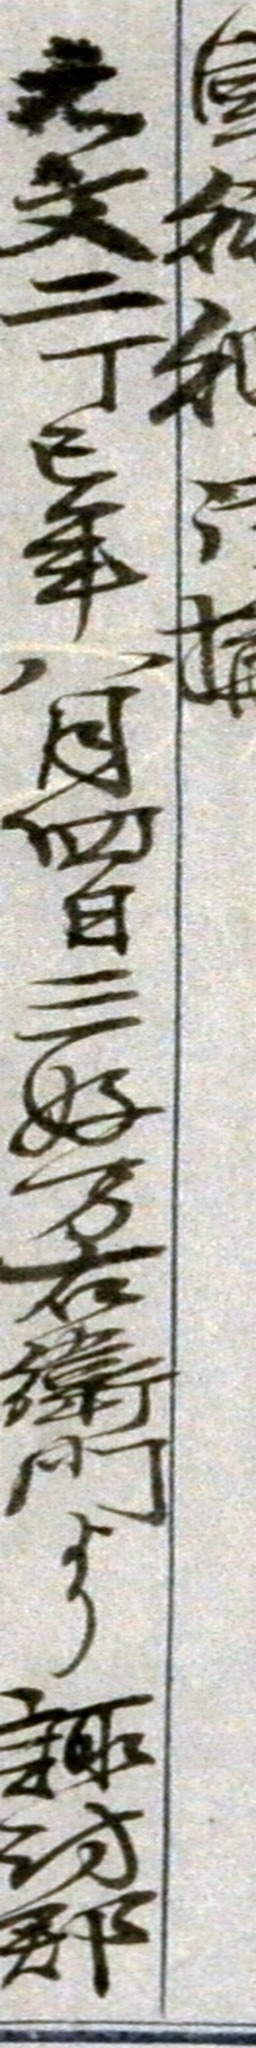元文二丁巳年八月四日三好万右衛門より諏訪郡
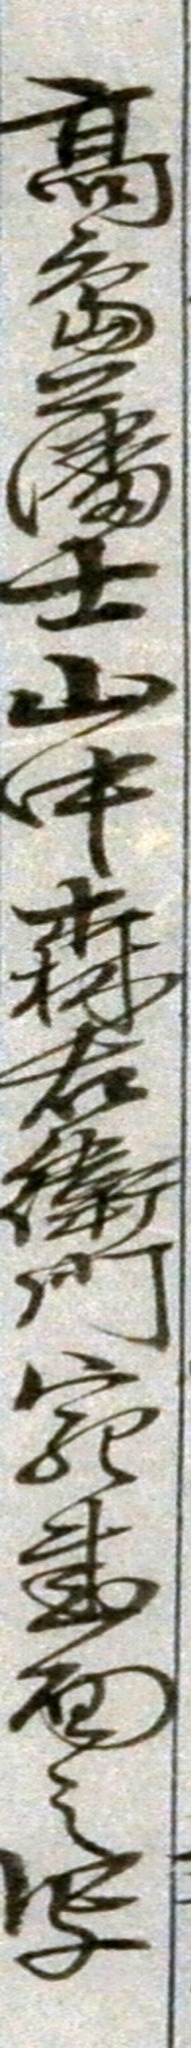高島藩士山中森右衛門宛書面之写
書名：三好氏先代以来勤仕録、池田丈介一家勤仕録
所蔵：伊那市立高遠町図書館・合同会社AMANE
